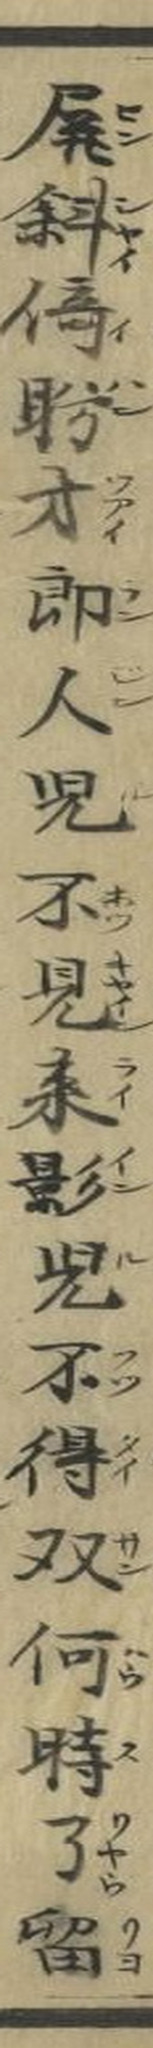屏斜倚盻才即人児不見来影児不得双何時了留
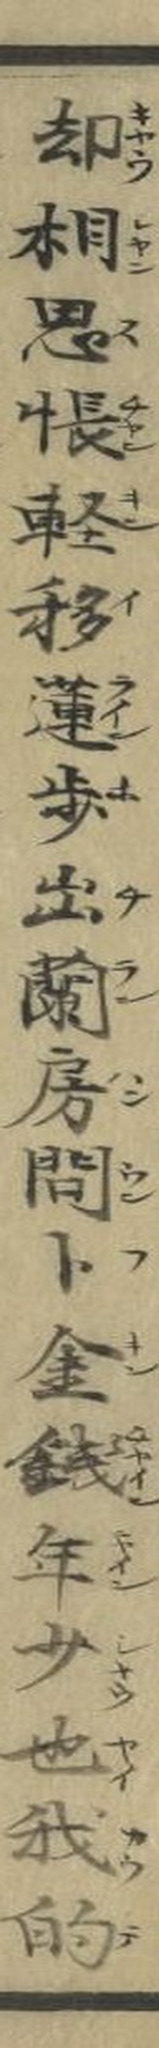却相思帳軽移蓮歩出蘭房問卜金銭年少也我的
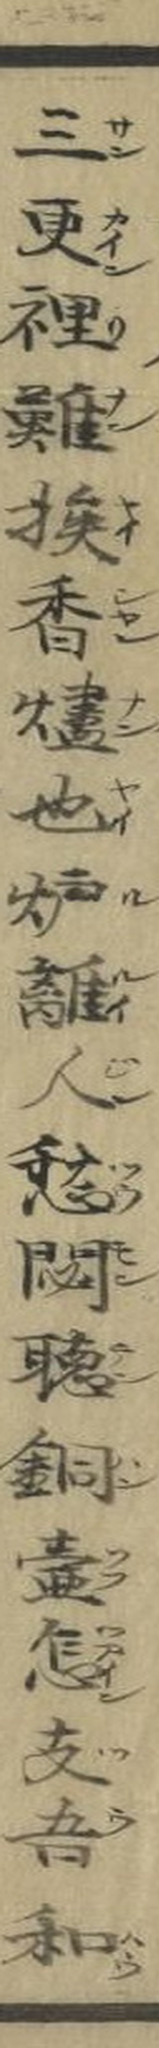三更難挨香燼也炉離人愁閟聴銅壺怎支吾和
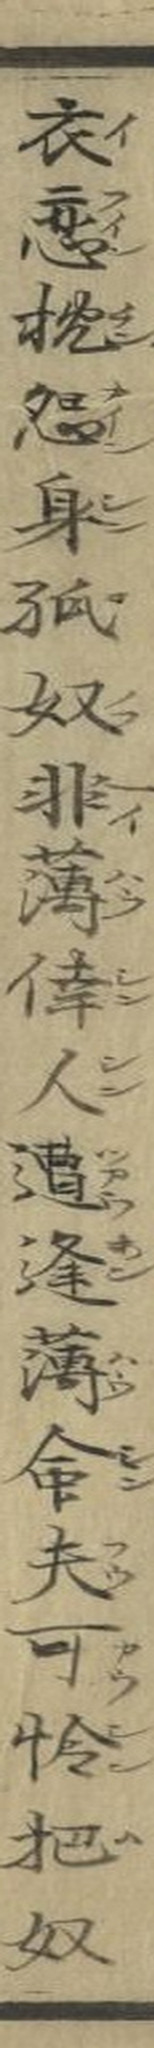衣恋枕怨身孤奴非薄倖人遭逢薄命夫可怜把奴
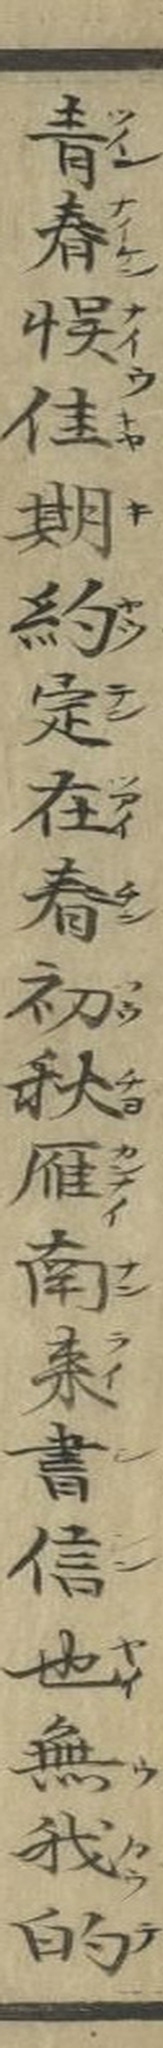青悞佳期約定在春初秋雁南来書信也無我的
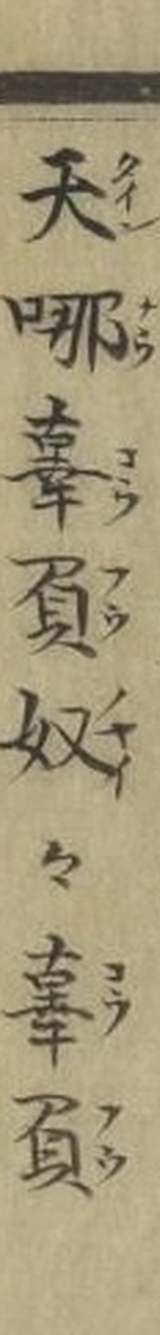天哪辜負奴々辜負
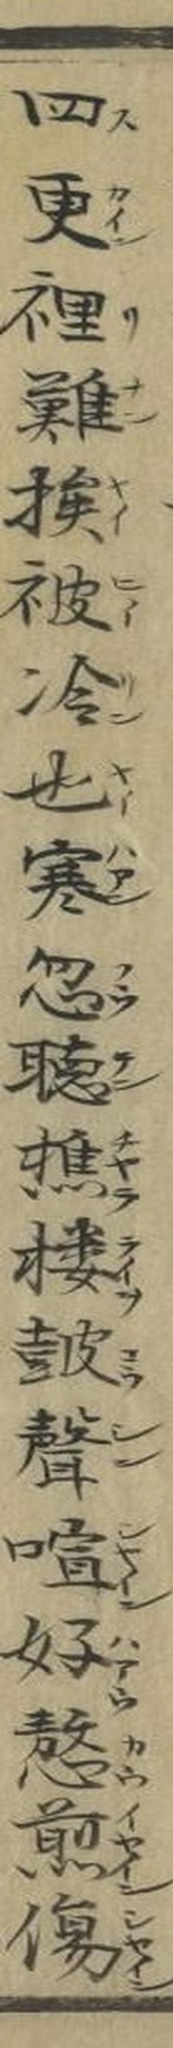四更裡難挨被冷也寒忽聴撨楼鼓聲喧好憨煎傷
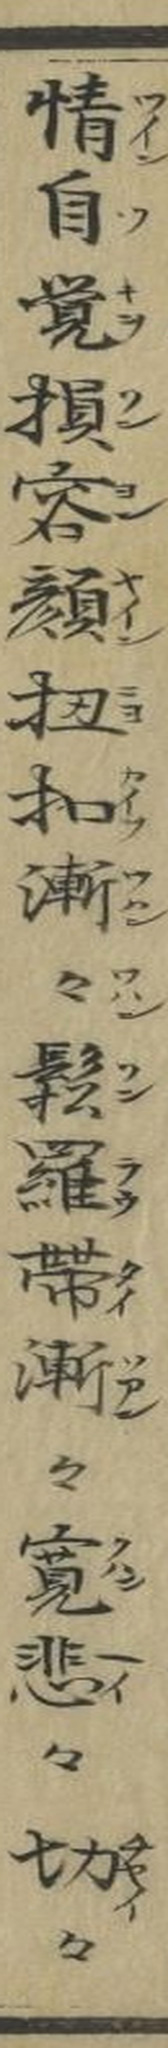情自覚損容顔扣漸々鬆帯漸々寛悲々切々
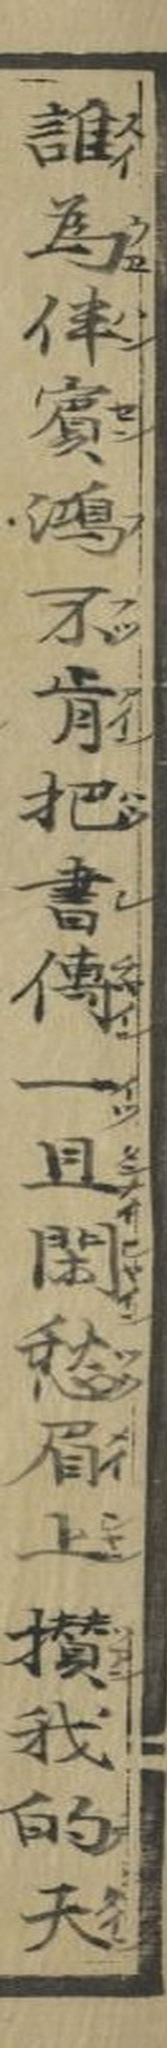誰為伴賨鴻不肯把書傳一且閑愁眉上攅我的天
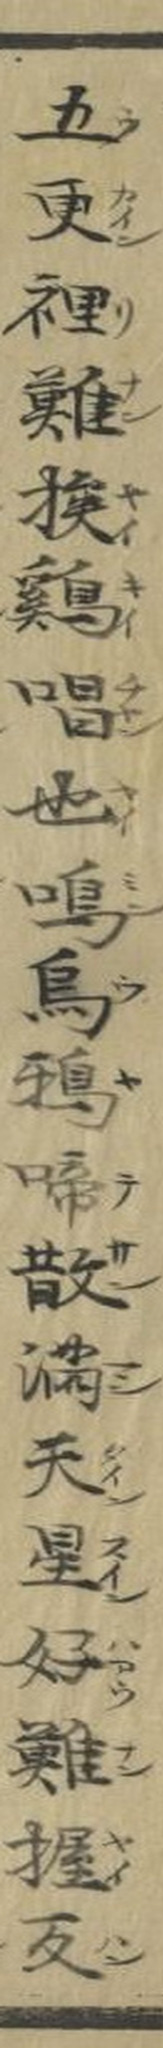五更裡難挨鶏唱也鳴烏鴉啼散満天星好難握反
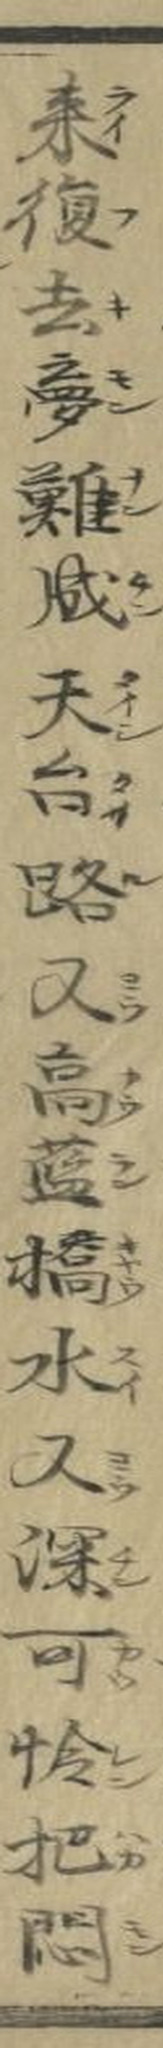来復去夣難成天台路又高藍橋水又深可怜把悶
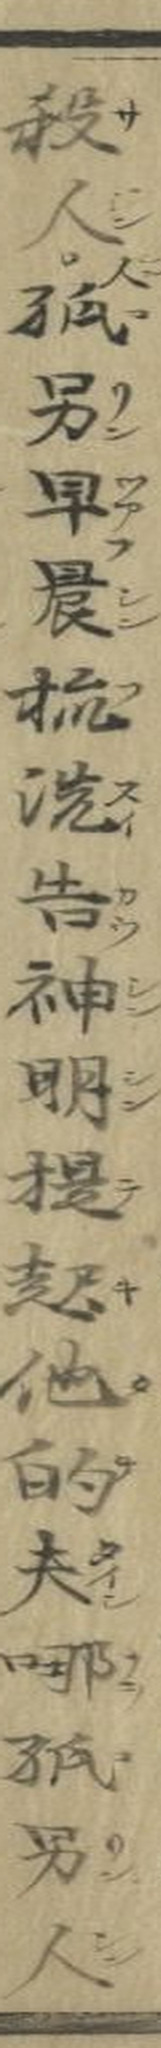殺人孤另早晨梳洗告神明提起他的夫哪孤男人
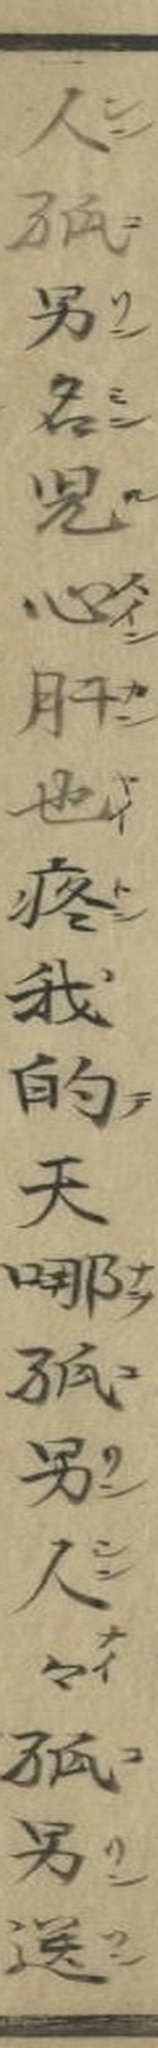人孤男名児心肝く疼我的天哪孤人々孤男送
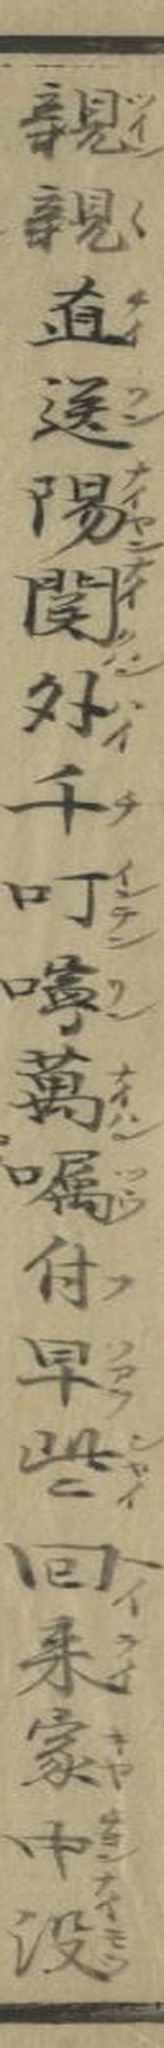親親直送陽関外千叮嚀萬嘱付早些囘来家中没
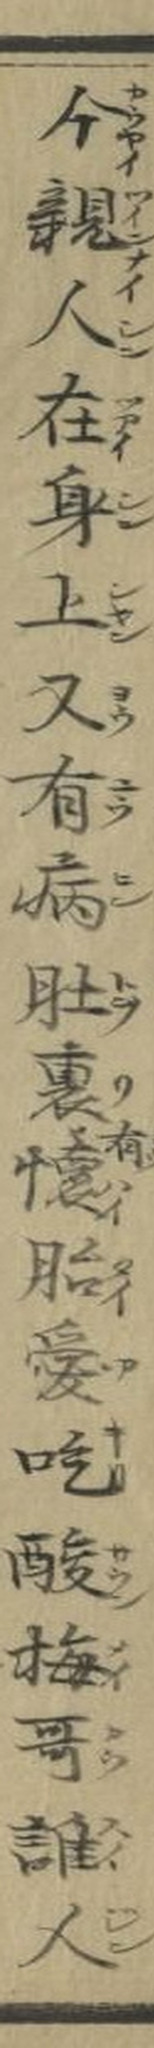今親人在身上又有病肚裏有懐胎愛吃酸梅哥誰人
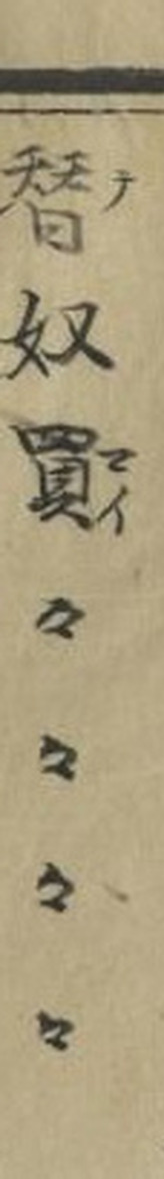替奴買々々々々
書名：琉球往来（下）
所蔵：University of the Ryukyus Library
